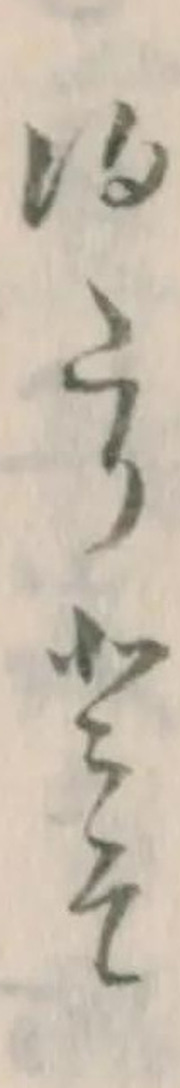得たりとそ
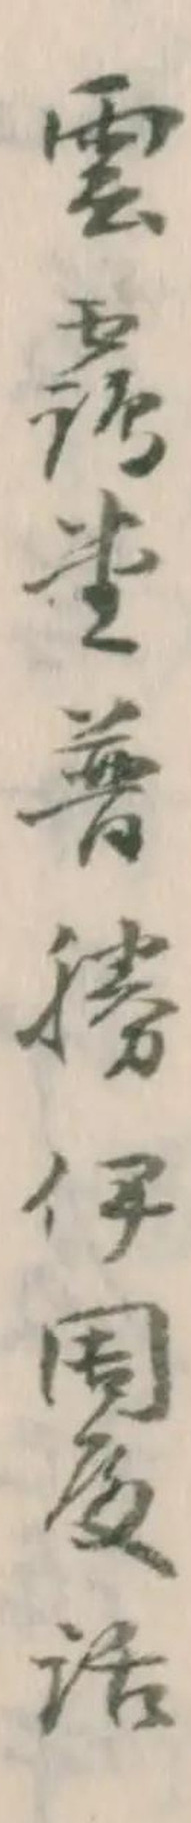雲鶴堂普勝伊周殿話
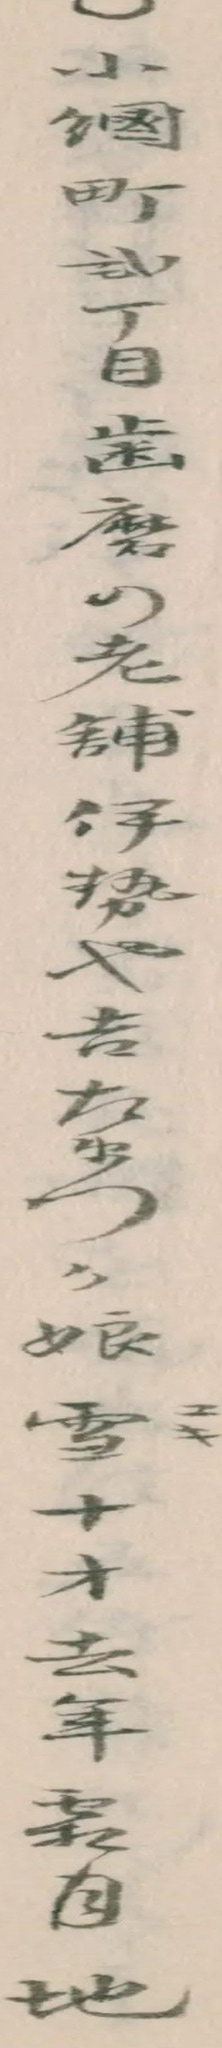〇小網町弐丁目歯磨の老舗伊勢や吉左衛門か娘雪十才去年霜月地
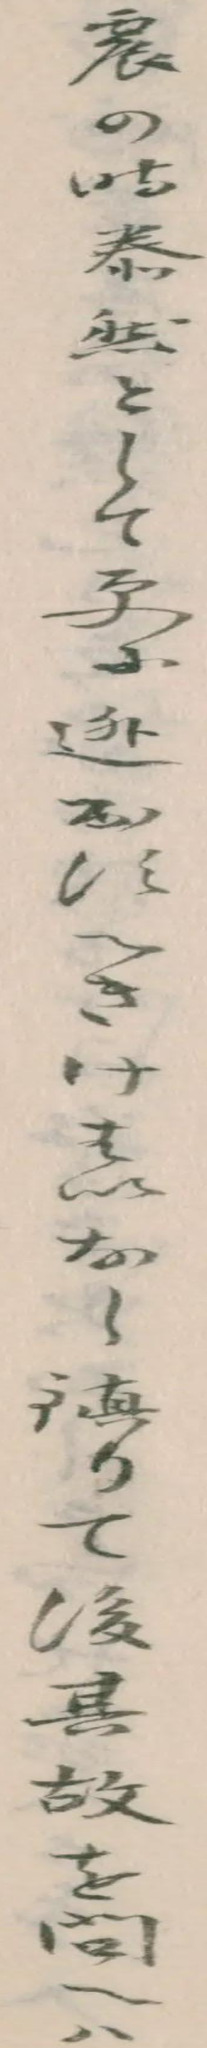震の時泰然として更に逃出すへきけはいなし鎮りて後其故を問へは
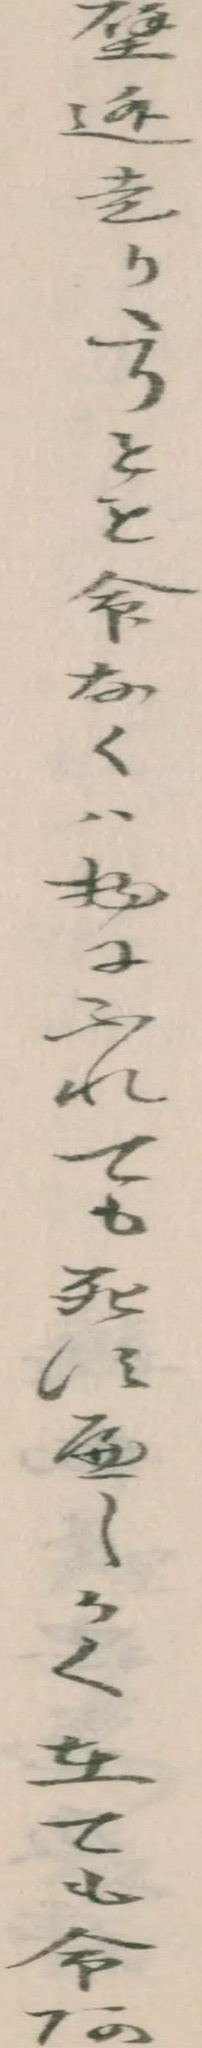壁逃走りたりとも命なくは物にふれても死すへしかく在ても命あ
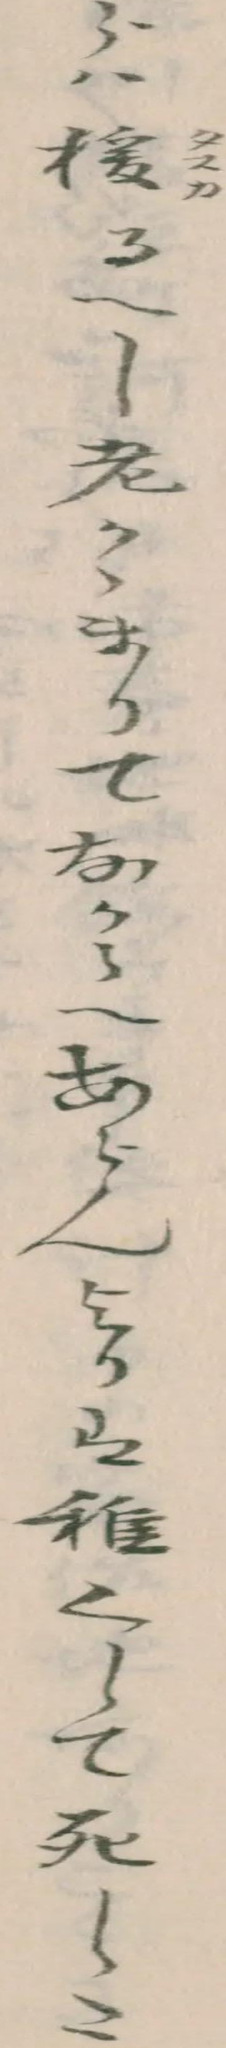らは援るへし老かゝまりてなからへあらんよりは稚くして死した
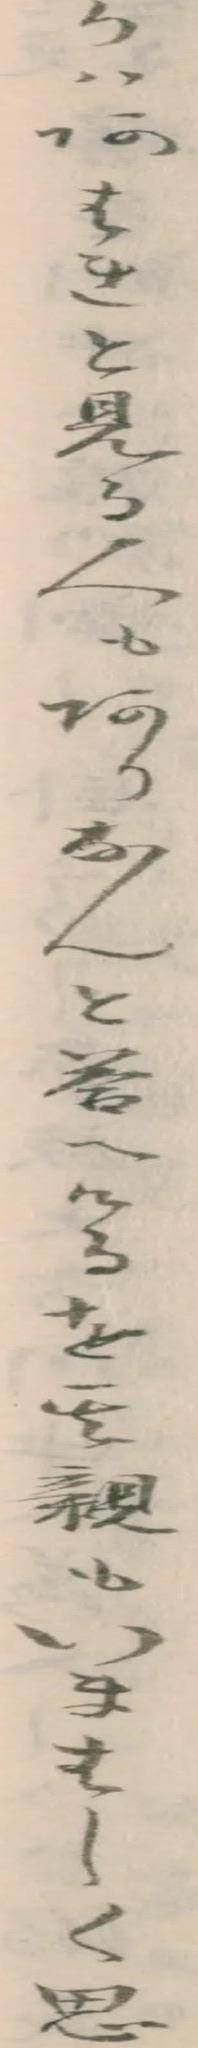らはあはれと見る人もありなんと答へけるを其親もいまはしく思
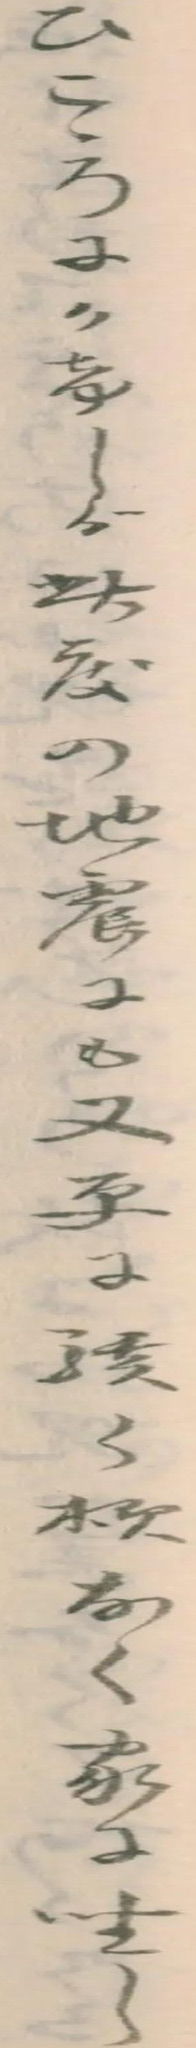ひこゝろにかけしが此度の地震にも又更に駭く様なく家に坐し
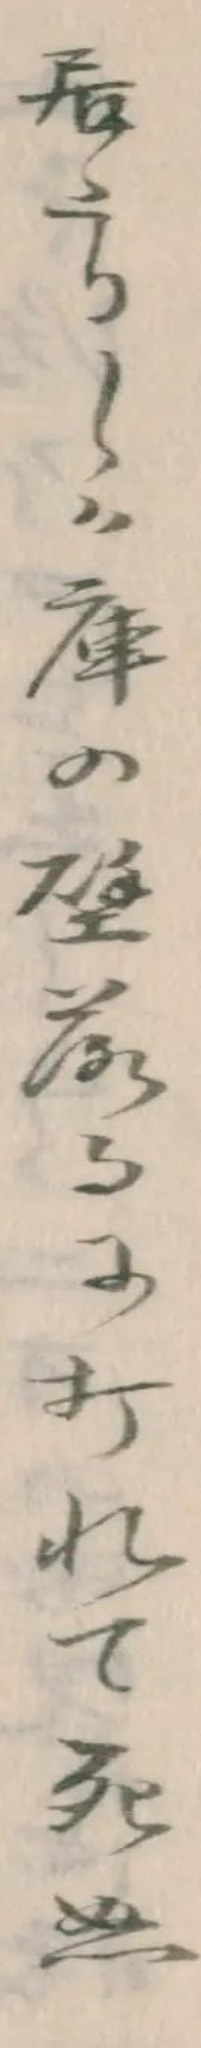居たりしか庫の壁落るに打れて死ぬ
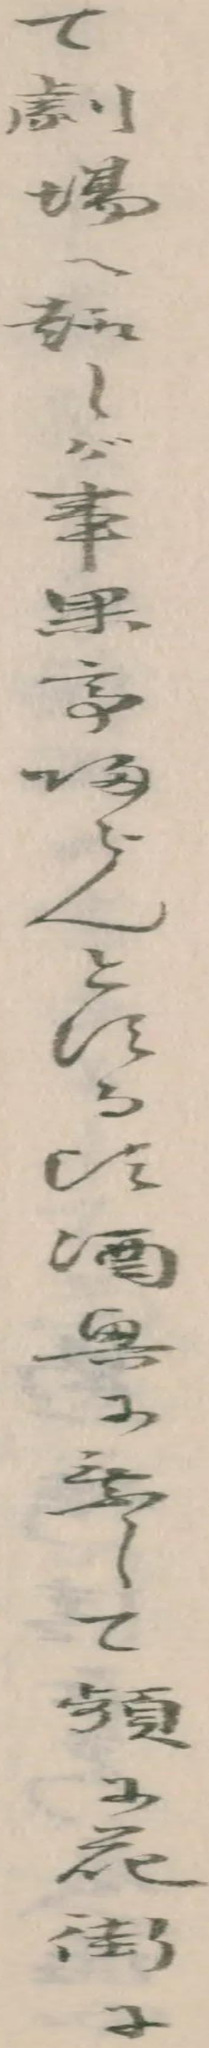て劇場へ趣きしが事果て帰らんとする頃酒興に乗して頻に花街に
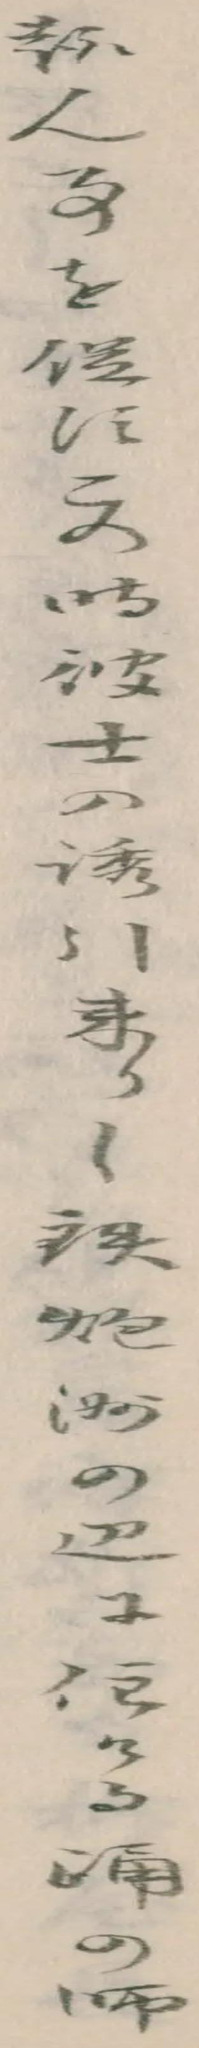趣ん事を促すこの時彼士の誘引来りし鉄炮洲の辺に住ける踊の師
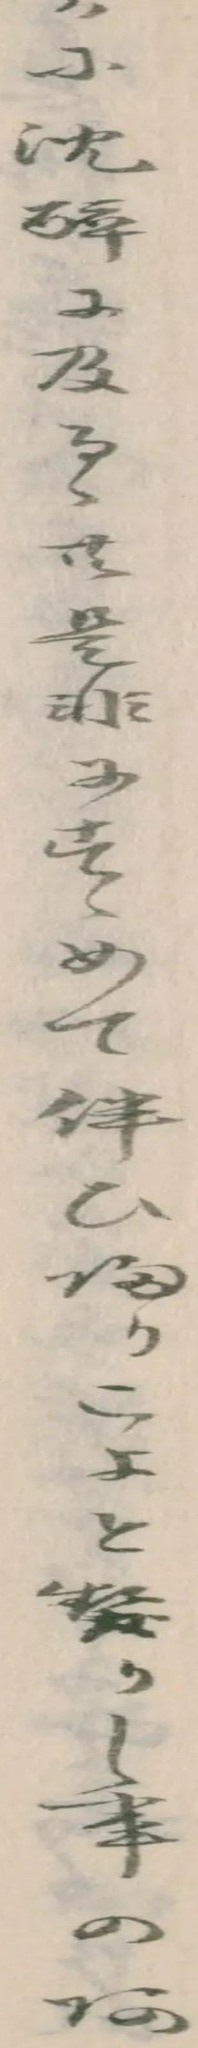かに沈酔に及るゝ共是非にすゝめて伴ひ帰りこよと契りし事のあ
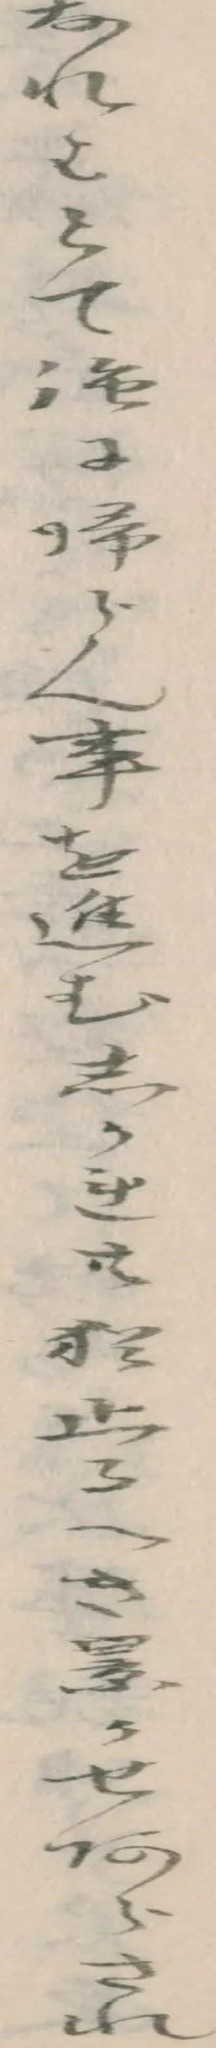なれはとて強に帰らん事を進むしかれ共猶止るへき景かせあらされ
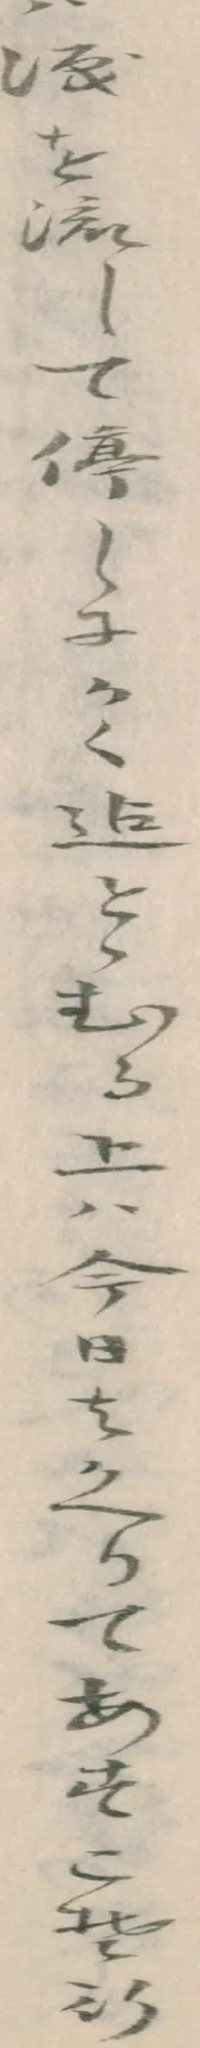は涕を流して停しにかく迄とゝむる上は今日はかへりてあすこそ行
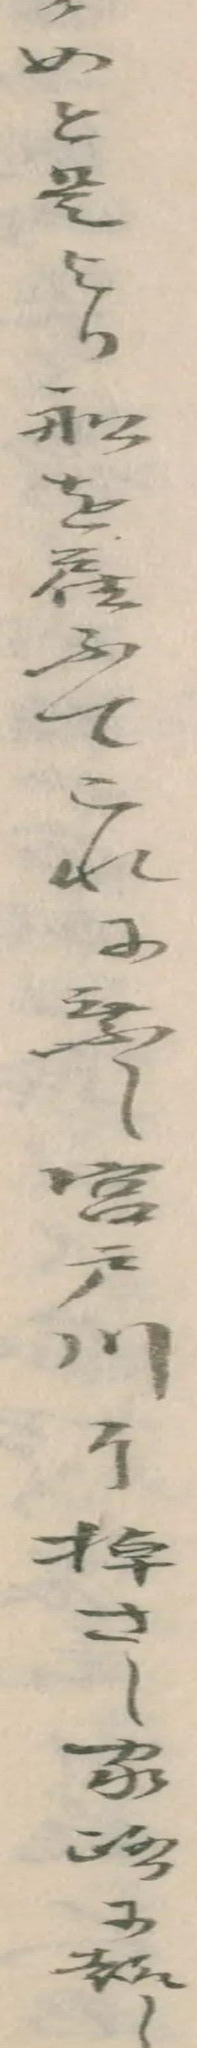かめと是より船を雇ふてこれに乗し宮戸川に棹さし家路に趣し

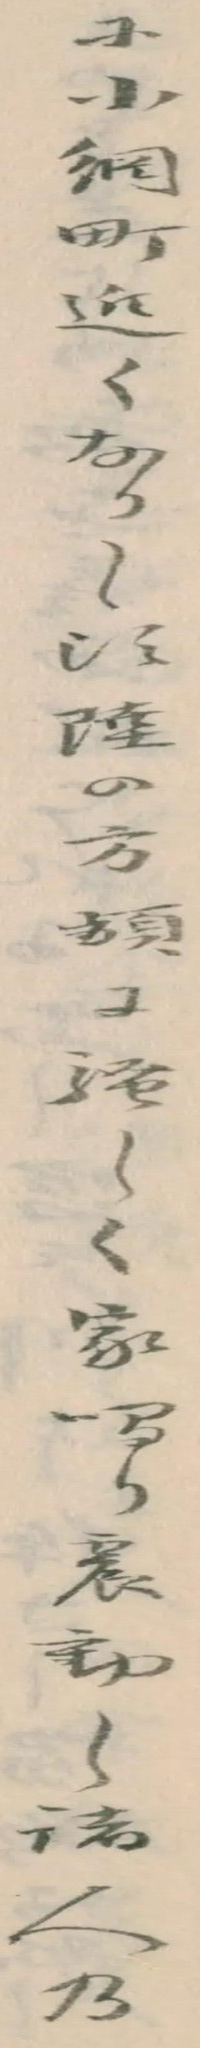に小網町近くなりし頃陸の方頻に騒しく家鳴り震動し諸人の
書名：地災撮要. 巻7-9(地震之部)
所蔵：国立国会図書館 National Diet Library, JAPAN
